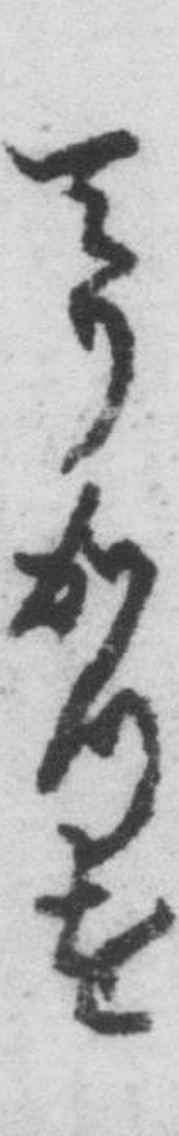てりかつを
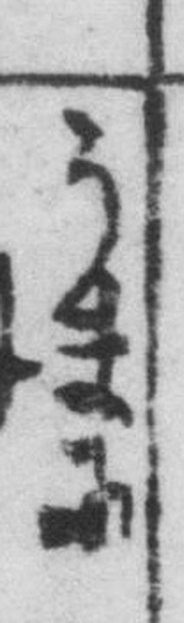うまに
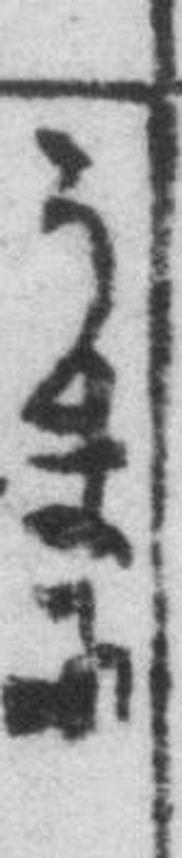うまに
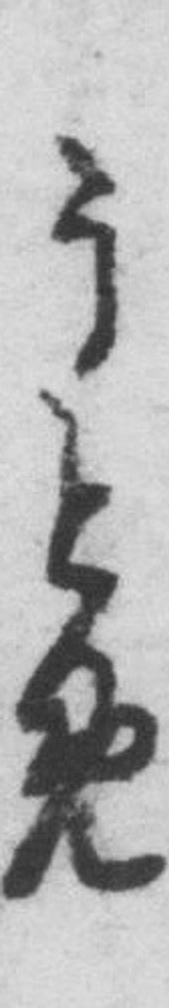うとめ
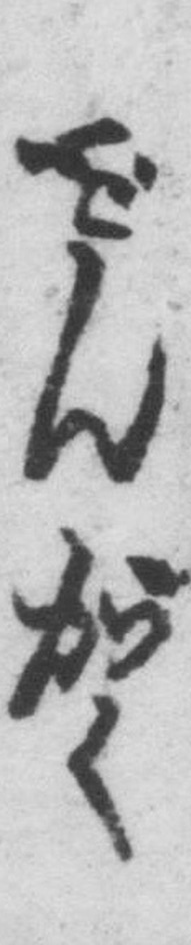でんがく
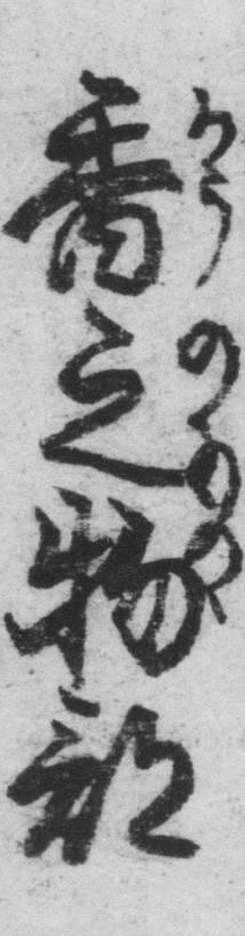香之物部

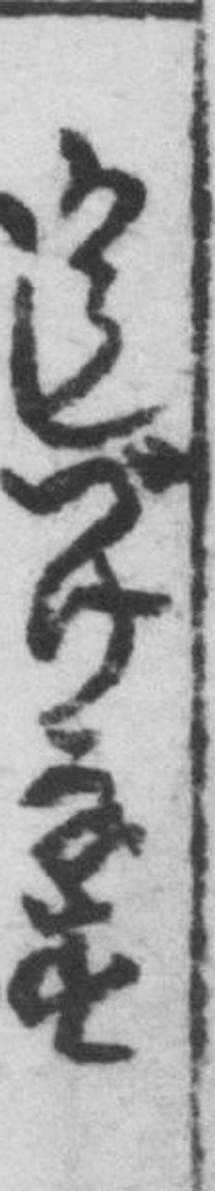からしづけなす
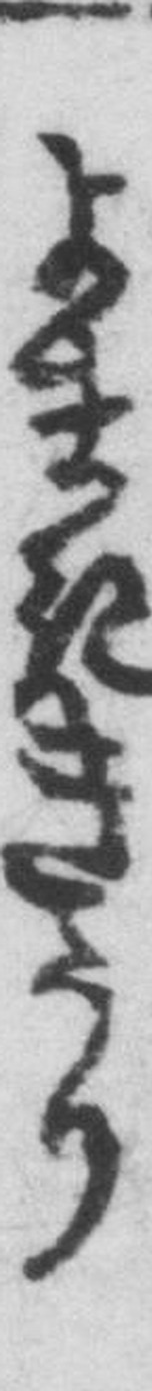よまききうり
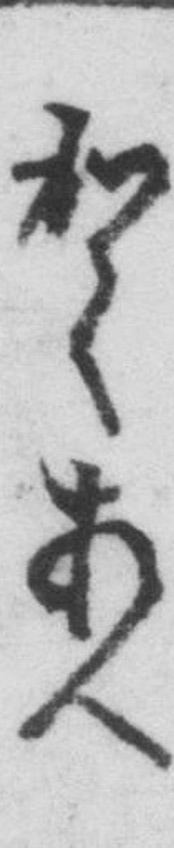かくあへ
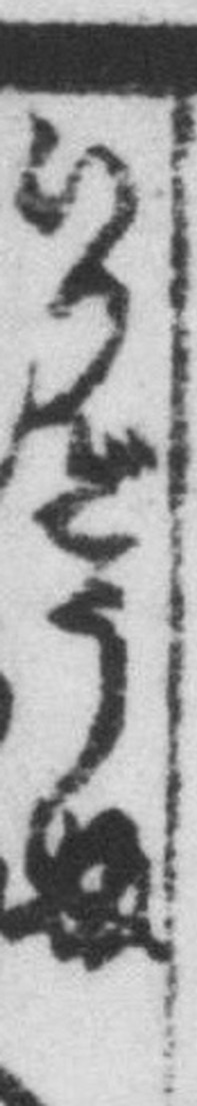いりどうふ
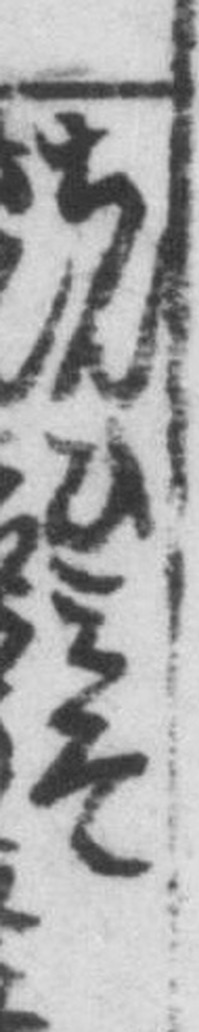ちんひミそ
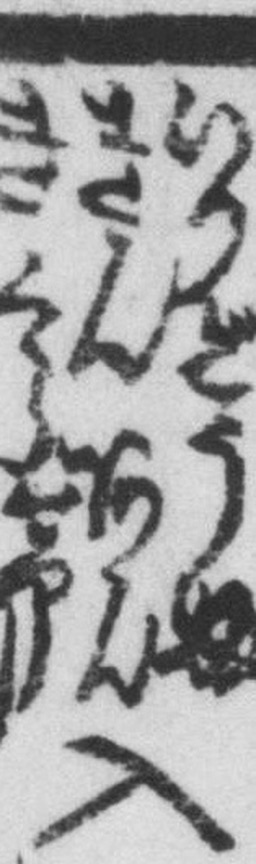きくらげ
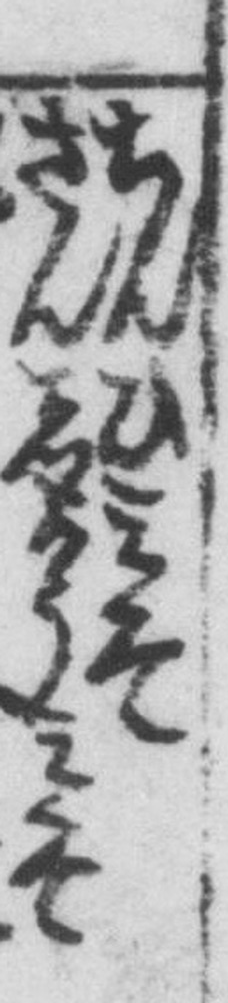さんしようミそ
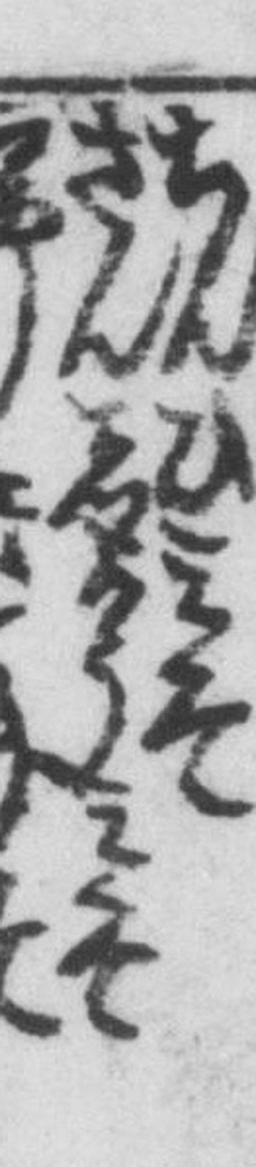さんしようミそ
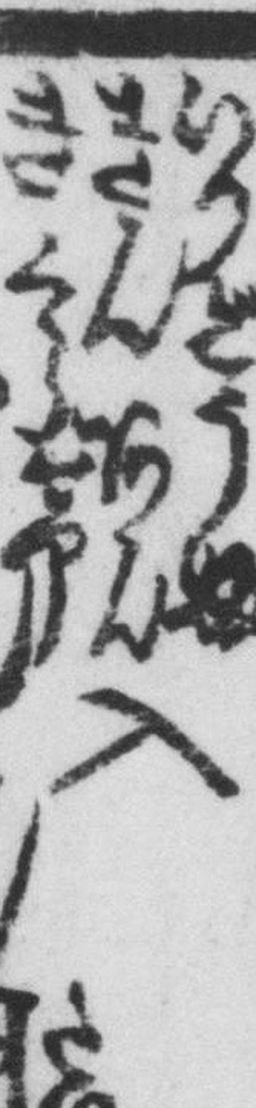きくらげ
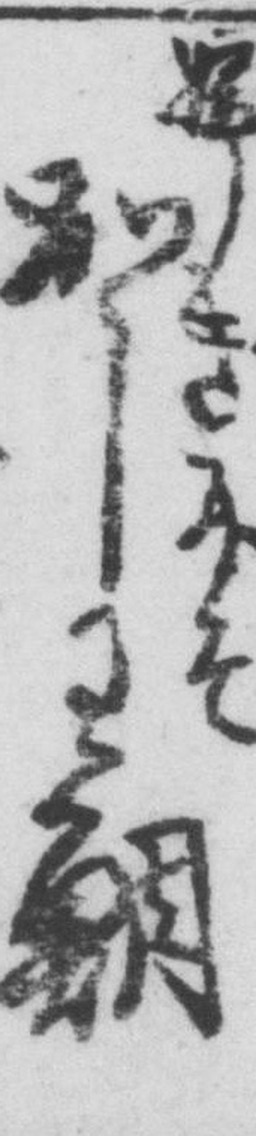かしわ鯛
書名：即席庖丁
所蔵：大阪府立大学学術情報センター 国文学研究資料館
